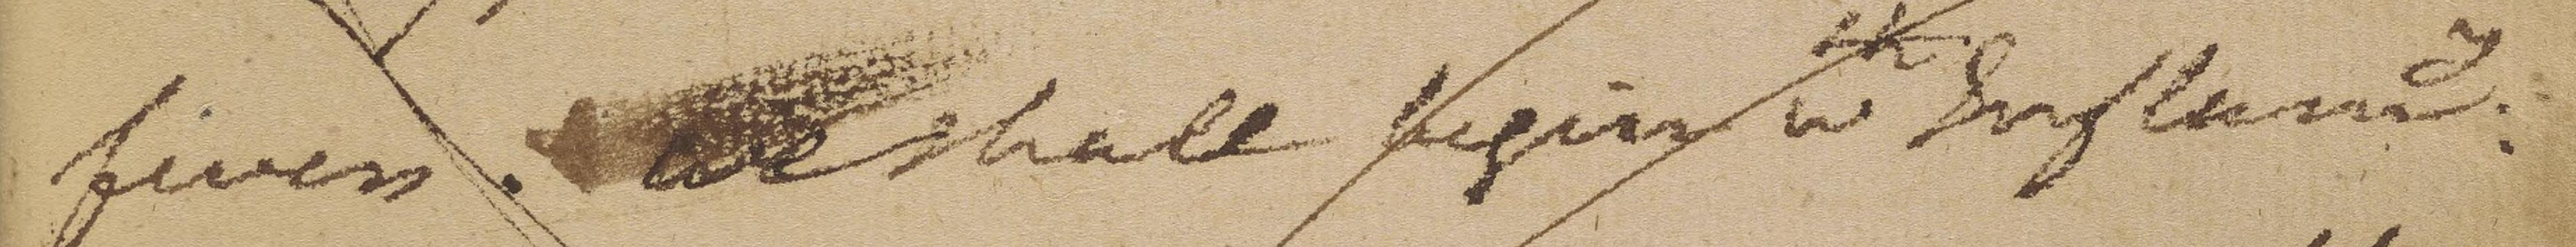fevers. We shall begin w^th inflam^y
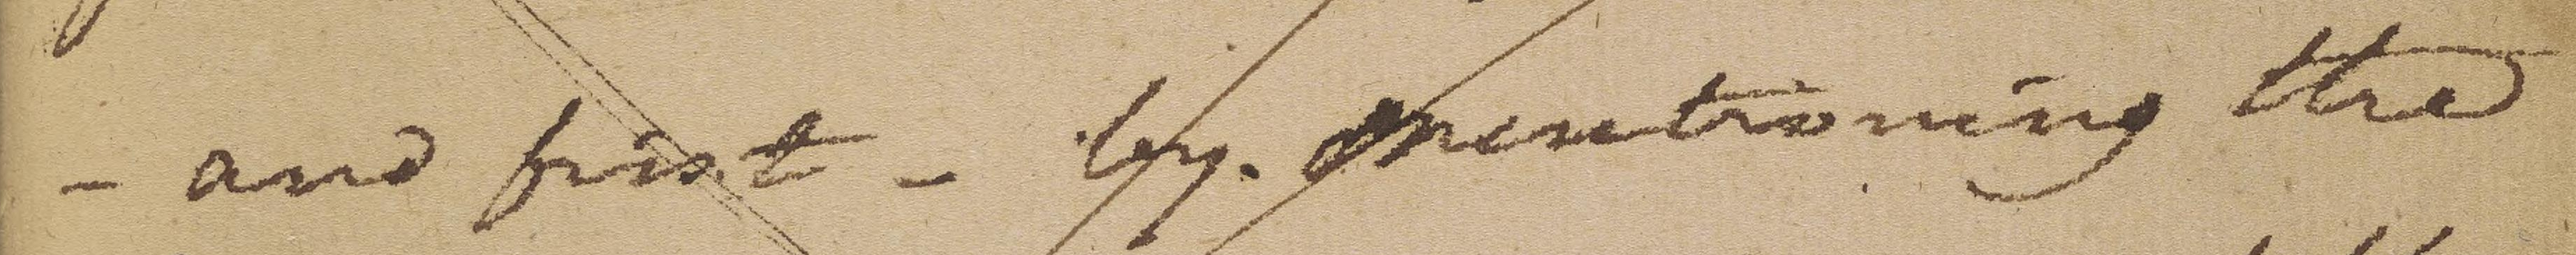- and first- by mentioning the
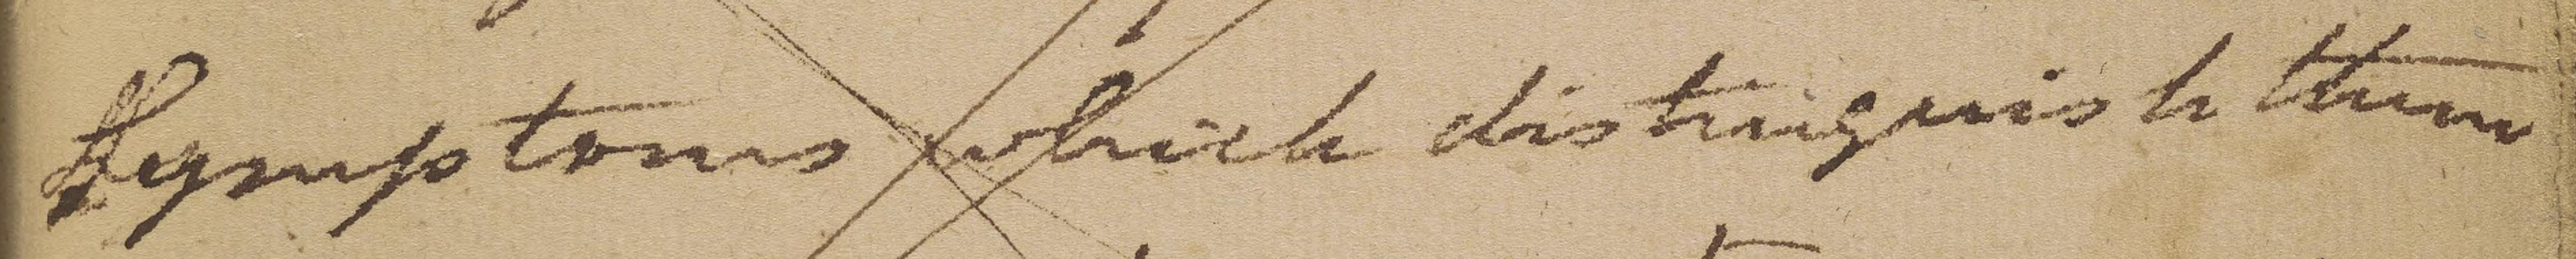Symptoms which distinguish the
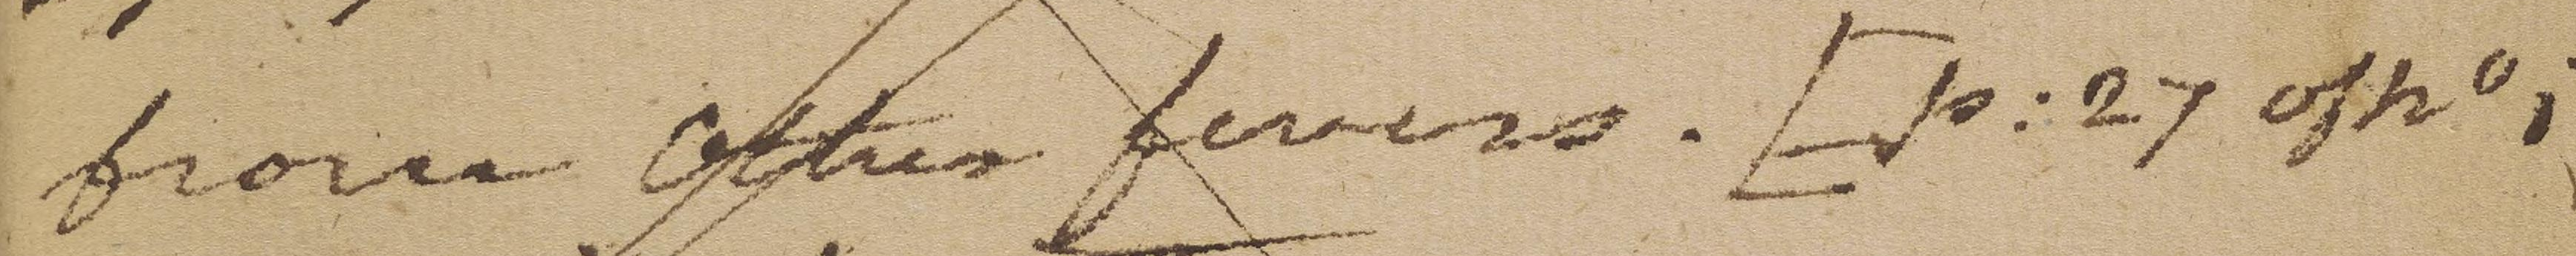from other fevers. (p. 27 of N^o 1
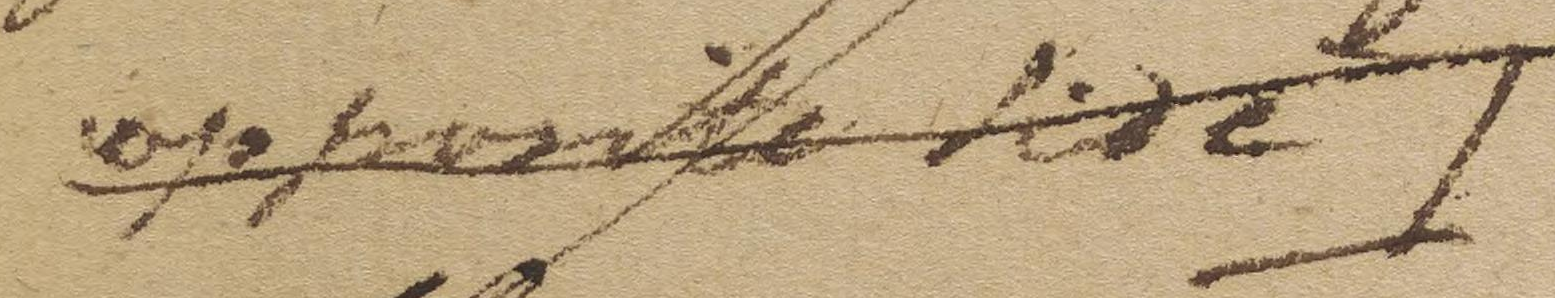opposite side)
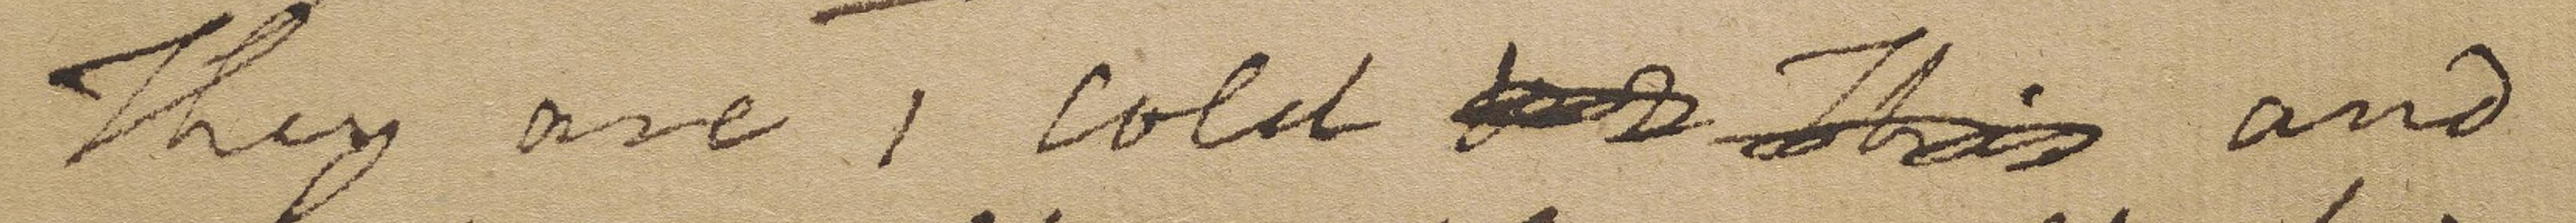They are 1 Cold [___] [This] and
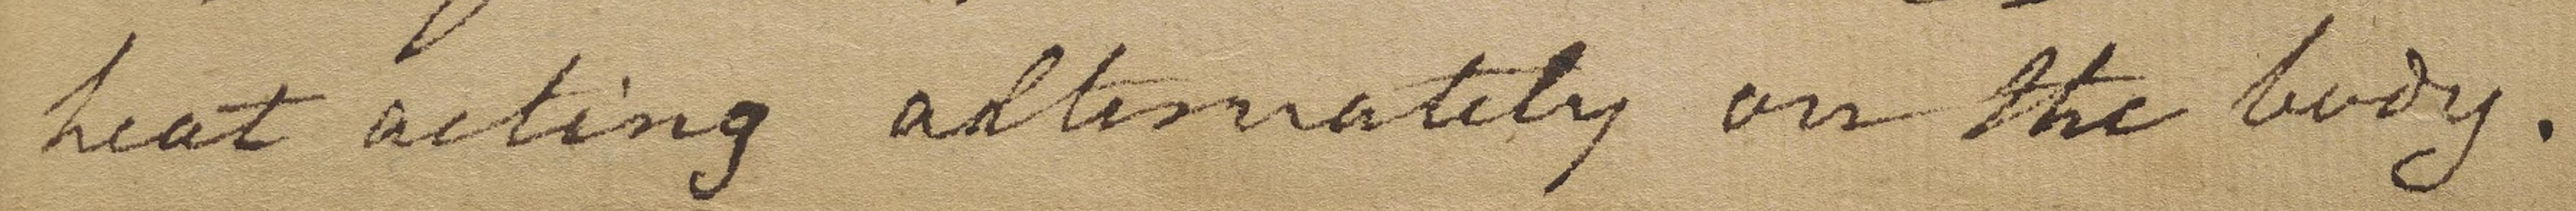heat acting alternately on the body.
